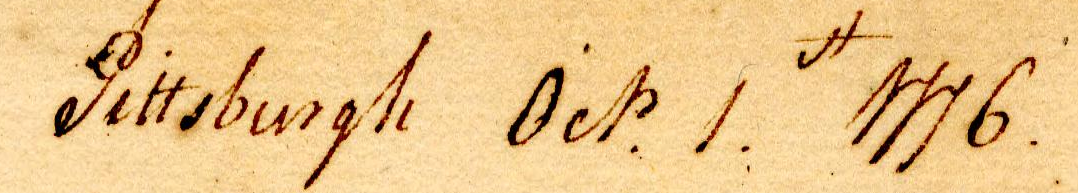Pittsburgh Oct^r. 1^st. 1776.
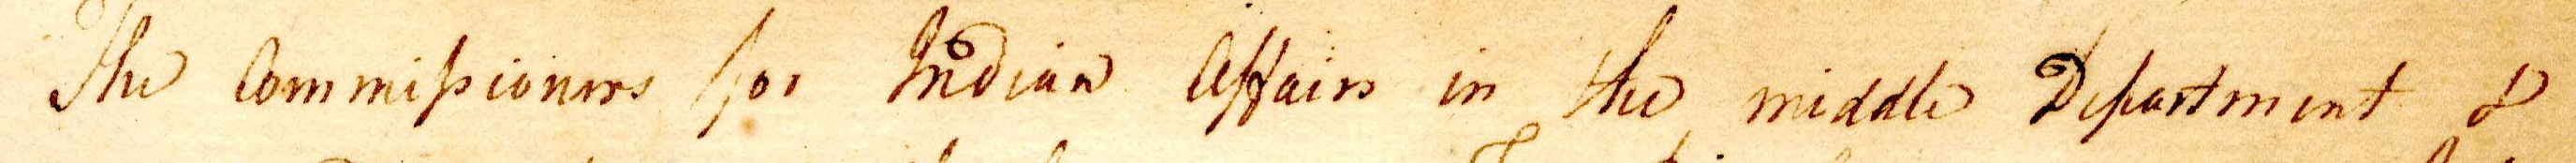The Commissioners for Indian Affairs in the middle Department &
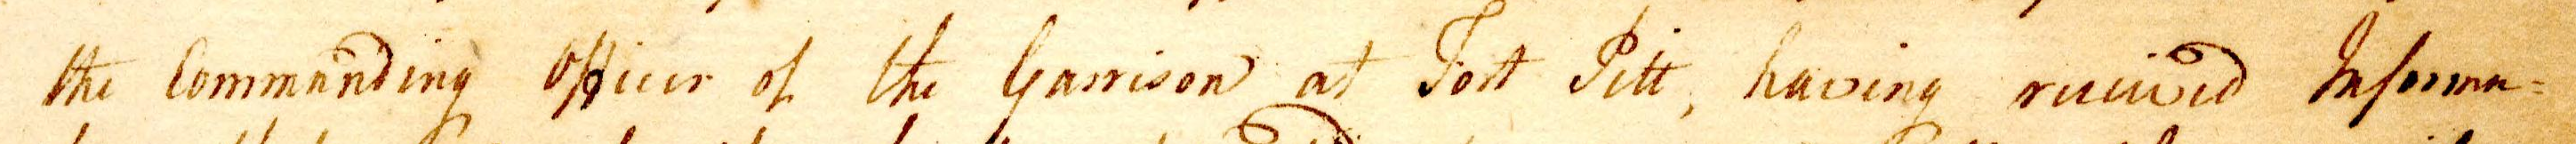the Commanding officer of the Garrison at Fort Pitt having received Informa-
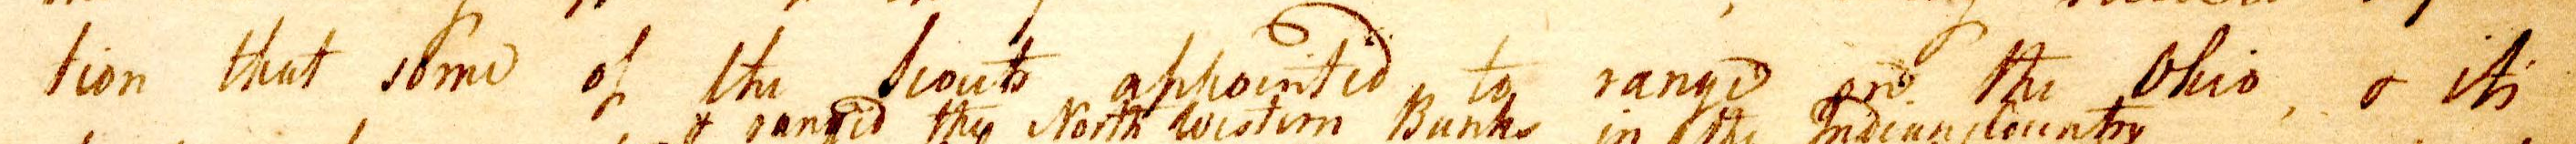tion that some of the Scouts, appointed to range on the Ohio & its
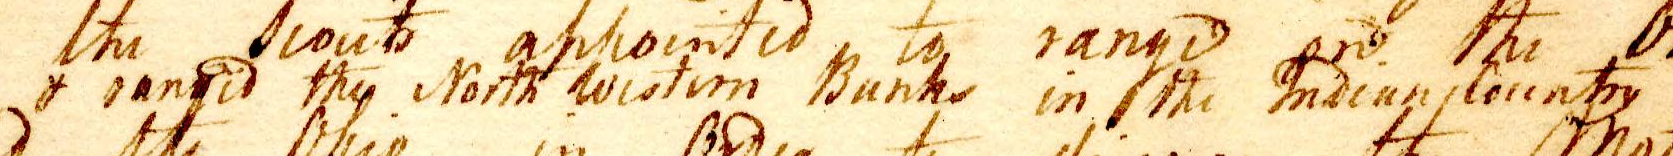& ranged the North Western Banks in the Indian Country
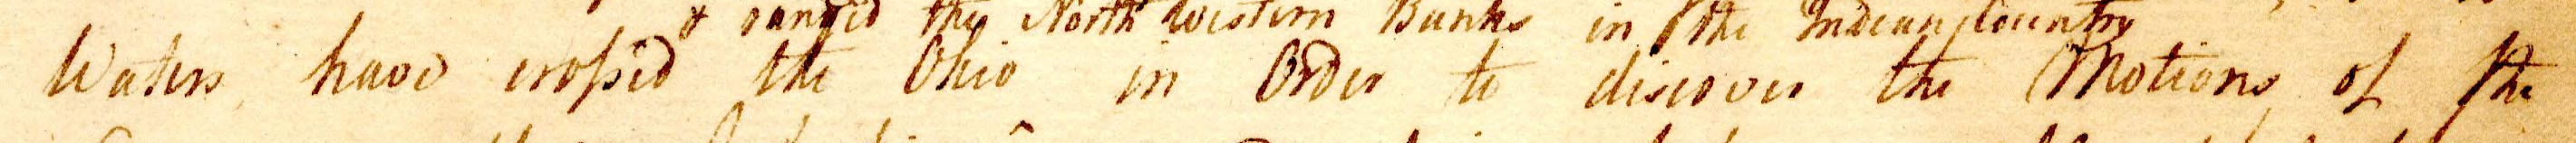Waters have crossed the Ohio^ in Order to discover the Motions of the
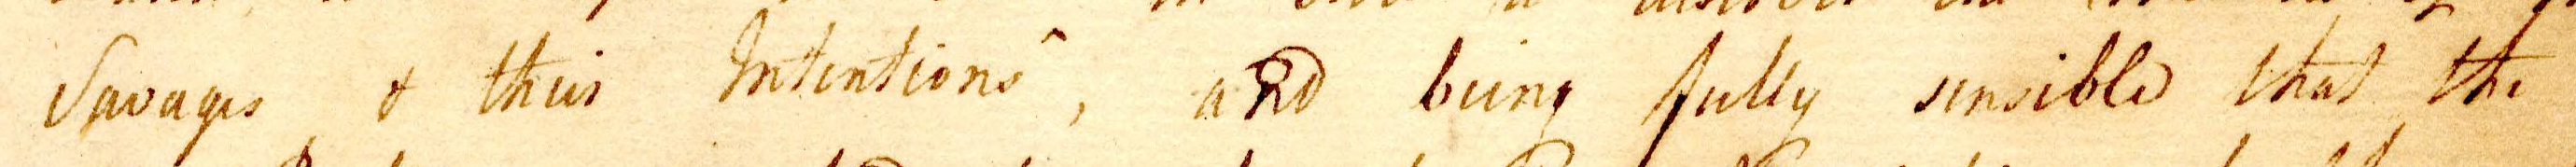Savages & their Intentions, and being fully sensible that the
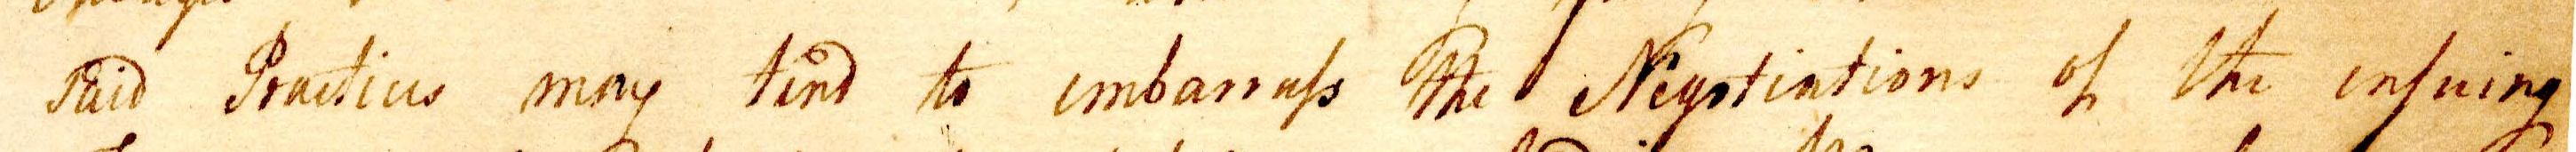said Practices may tend to embarrass the Negotiations of the ensuing
